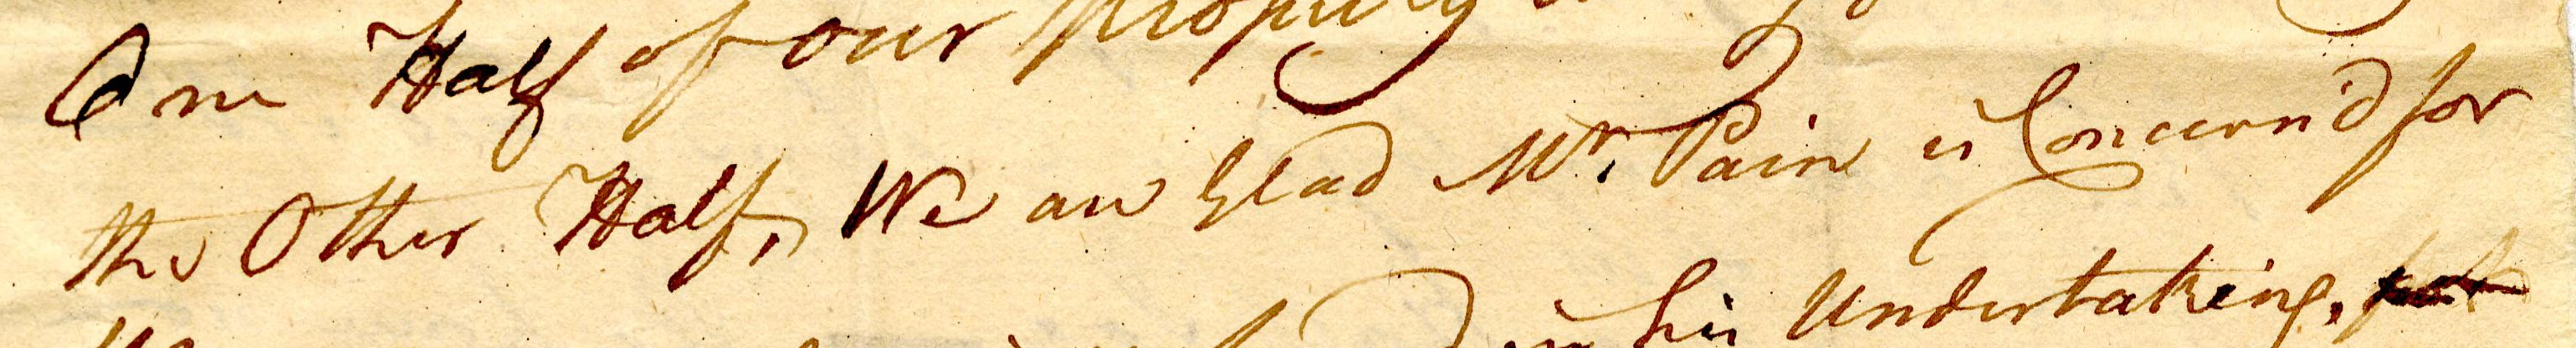the Other Half, We are Glad M^r. Pain is Concern'd for
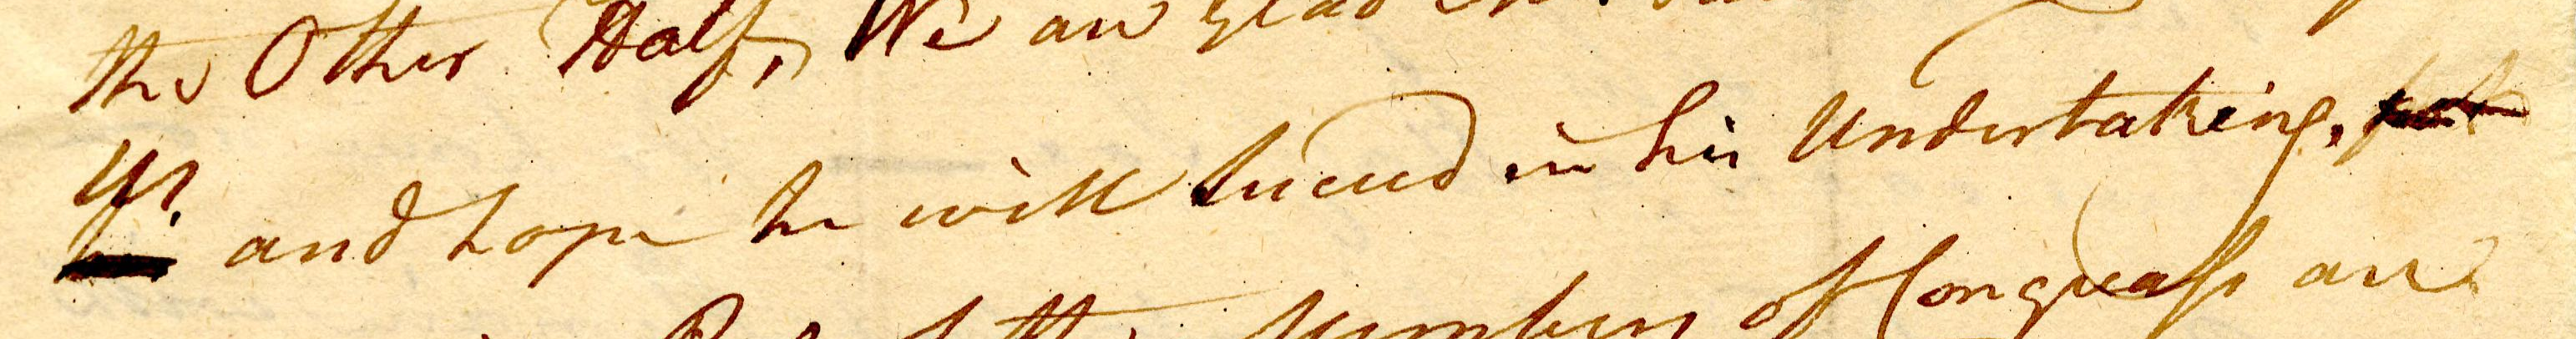uss and hope he will suceed in his Undertakeng, [___]
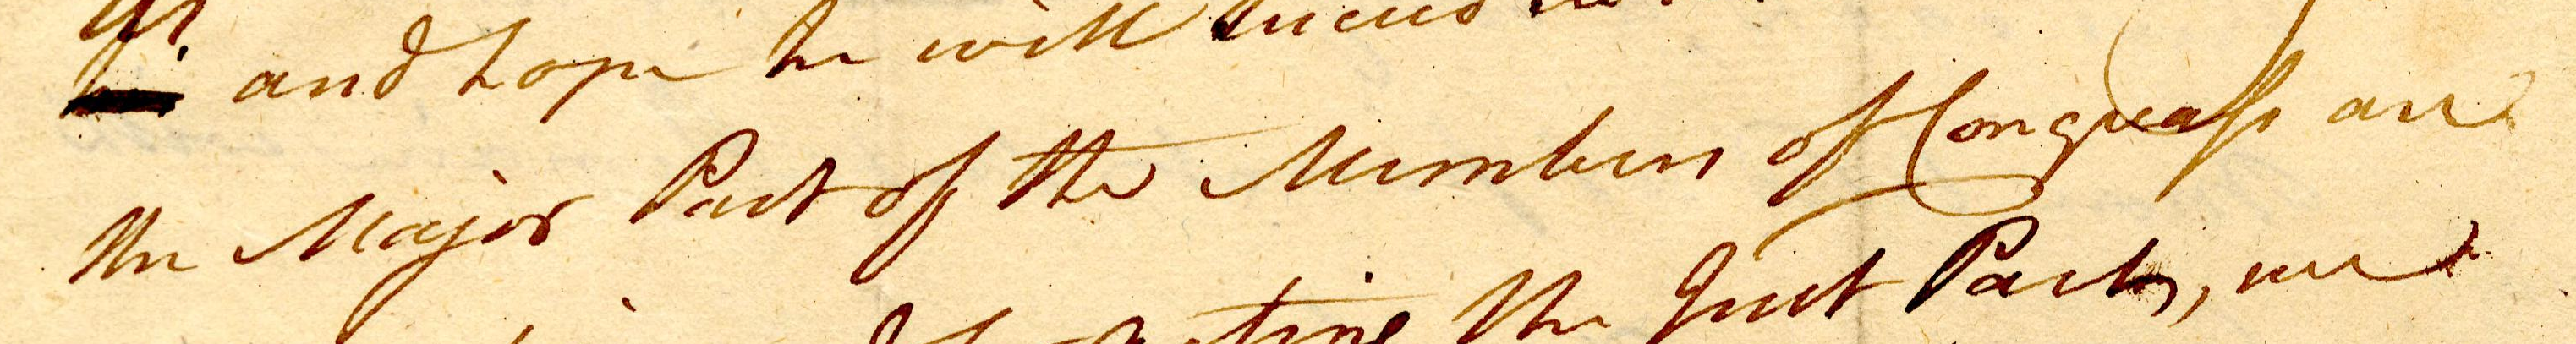the Major part of the Members of Congress are
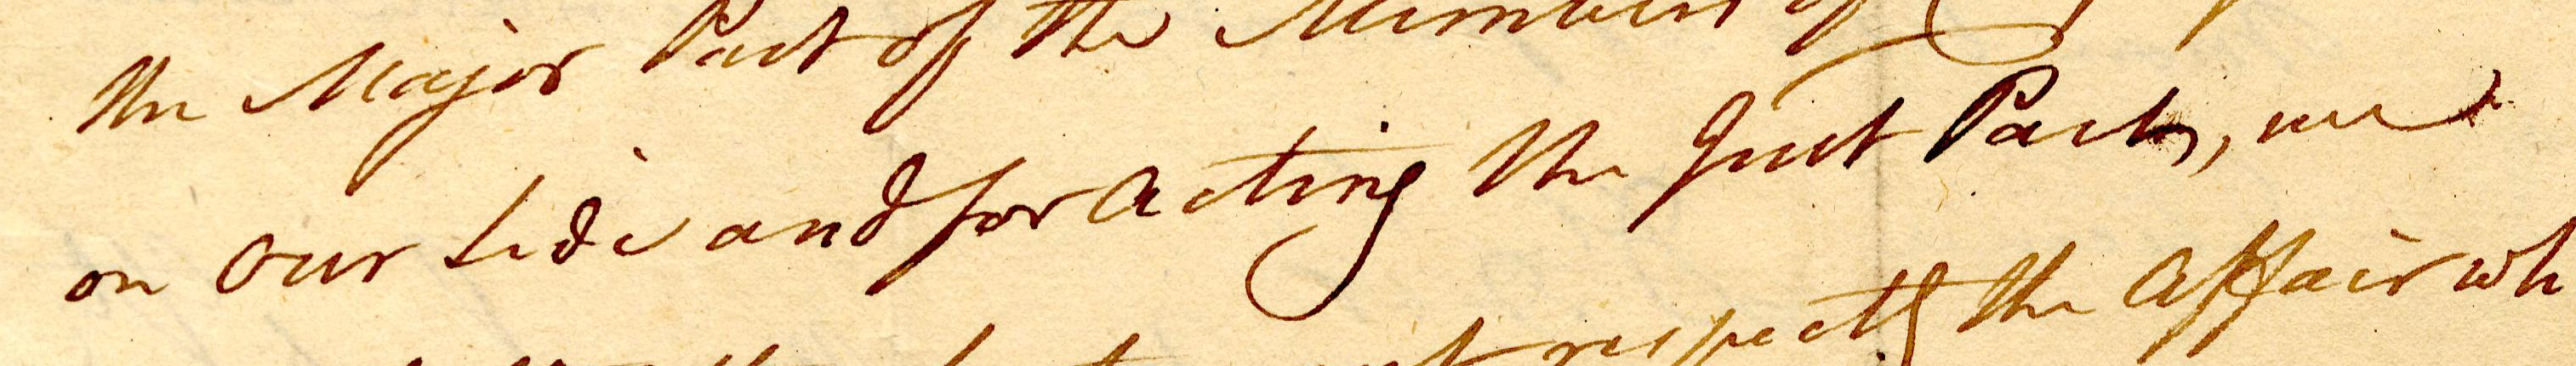on our side and for Acting the Just Part, we
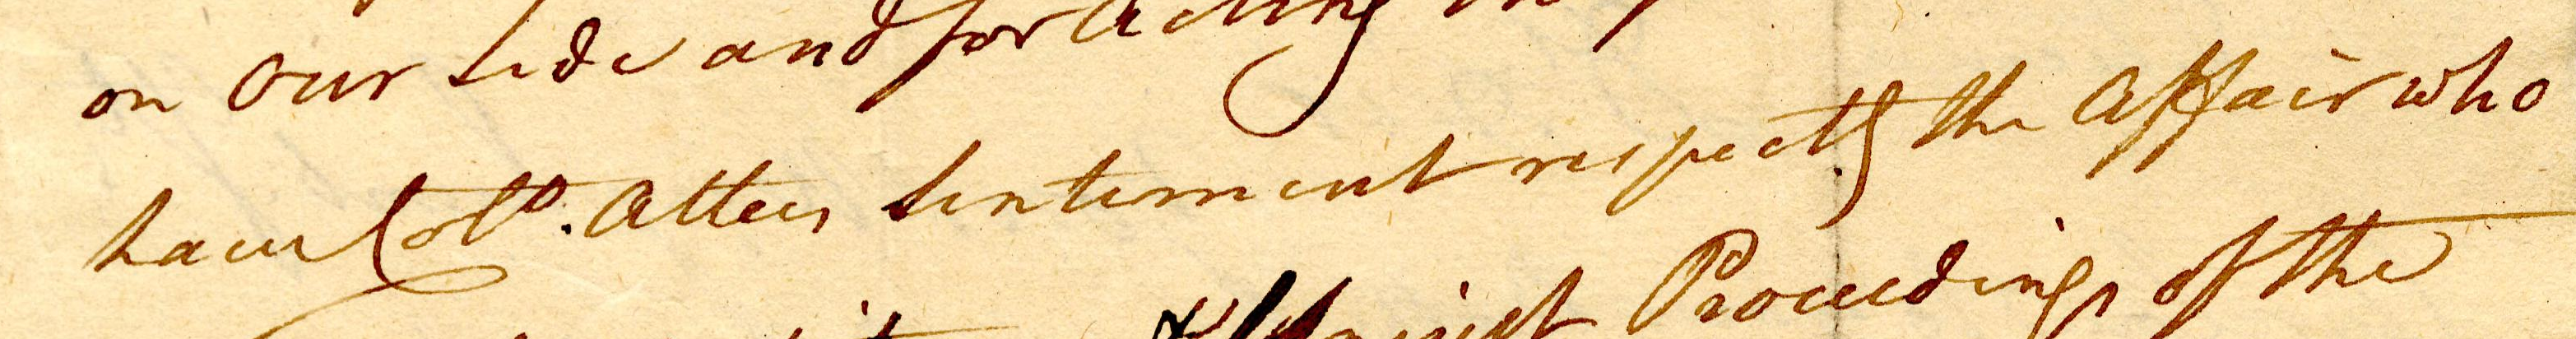have Col^o. Atter Sentement respectg the Affair who
